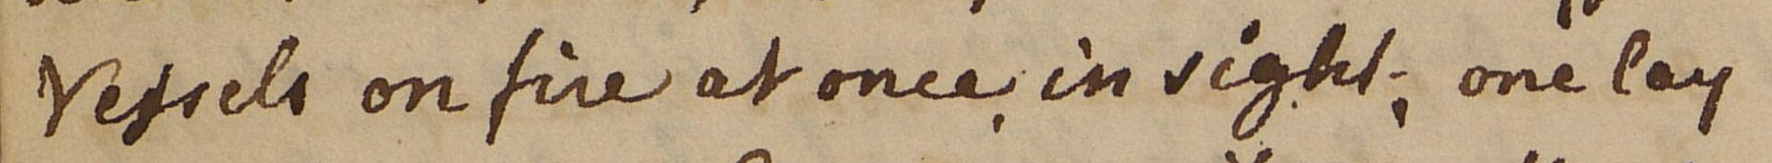Vessels on fire at once in sight, one lay
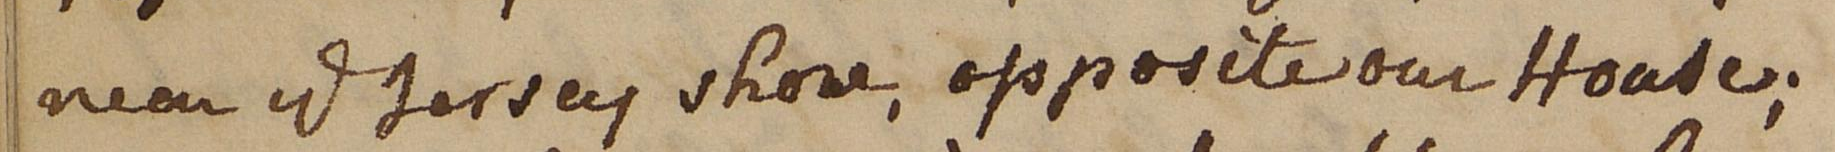near y^e Jersey shore, opposite our House;
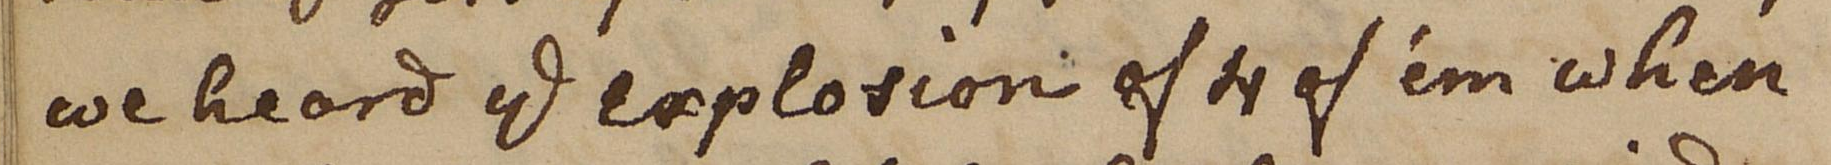we heard y^e explosion of 4 of 'em when
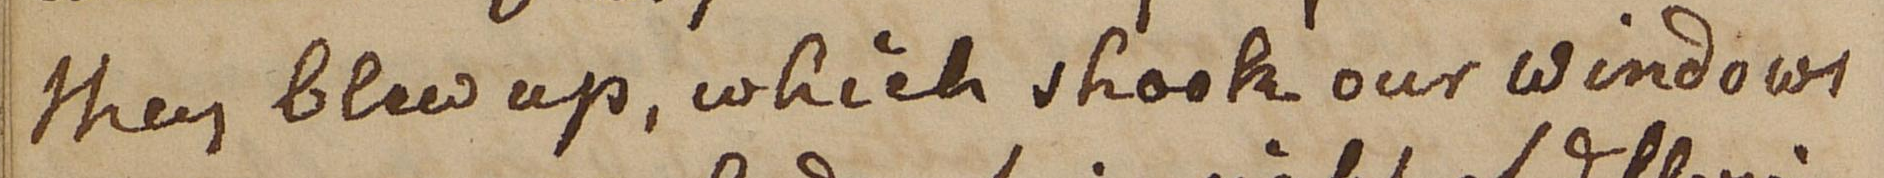they blew up, which shook our windows
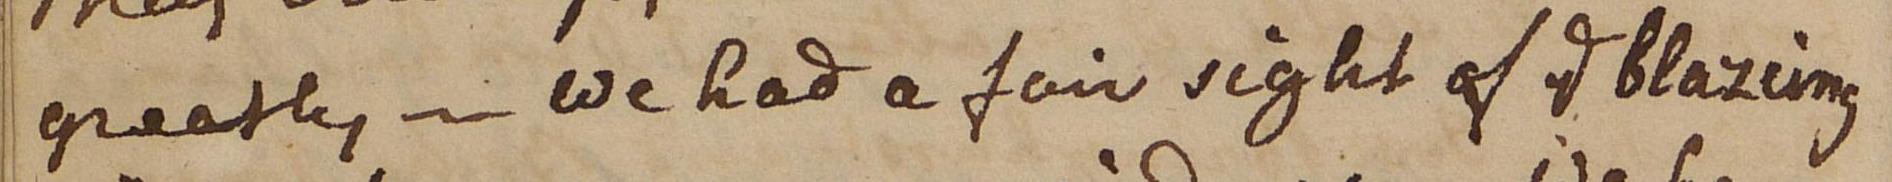greatly- we had a fair sight of y^e blazeing
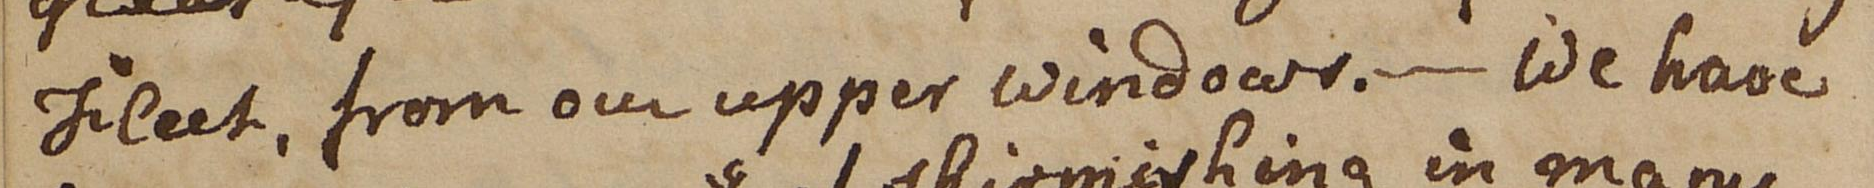Fleet, from our upper windows.- We have
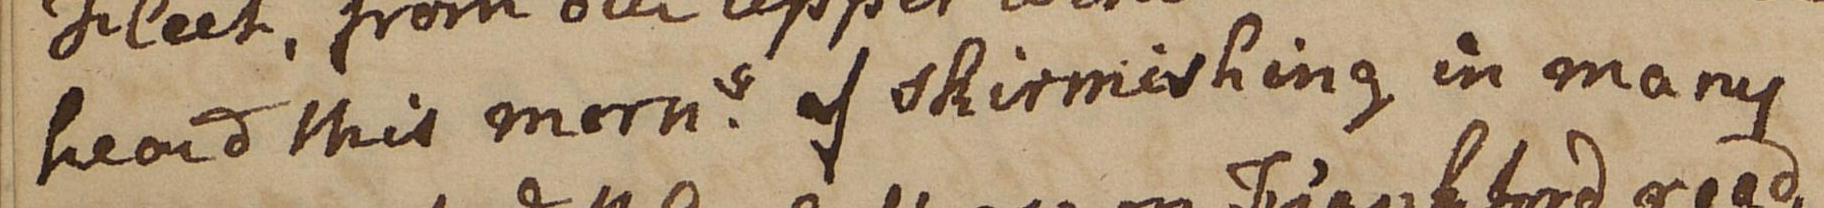heard this morn^g. of skirmishing in many
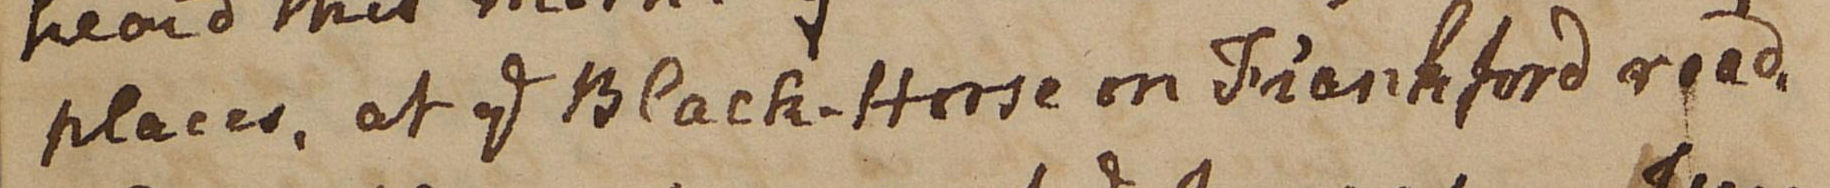places, at y^e Black-Horse on Frankford road,
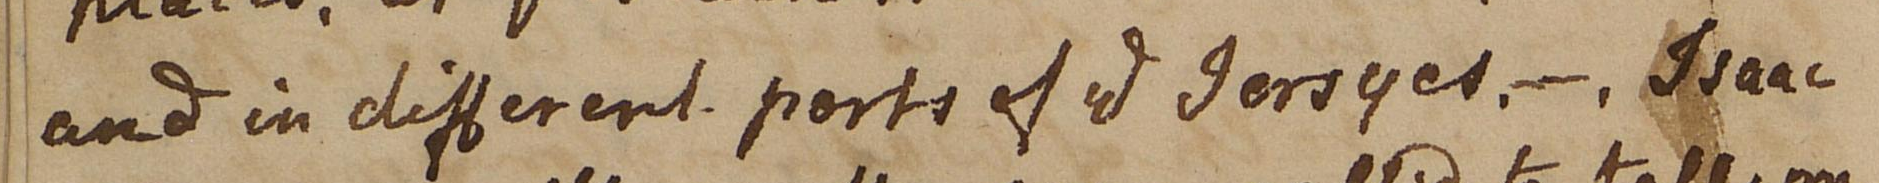and in different ports of y^e Jersyes,-, Isaac
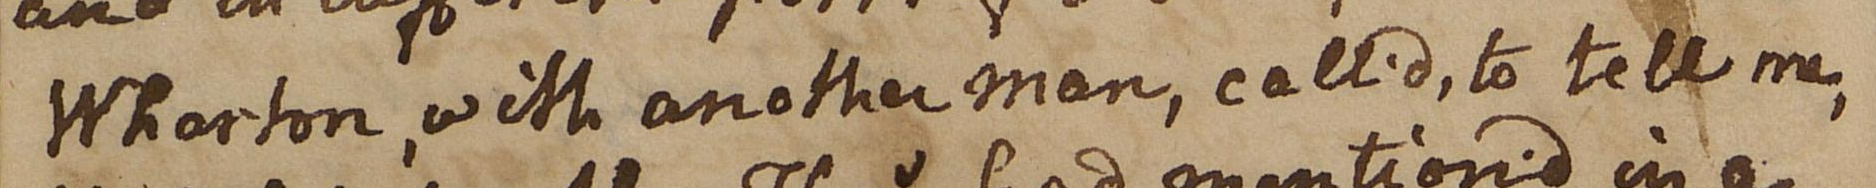Wharton, with another man, call'd, to tell me,
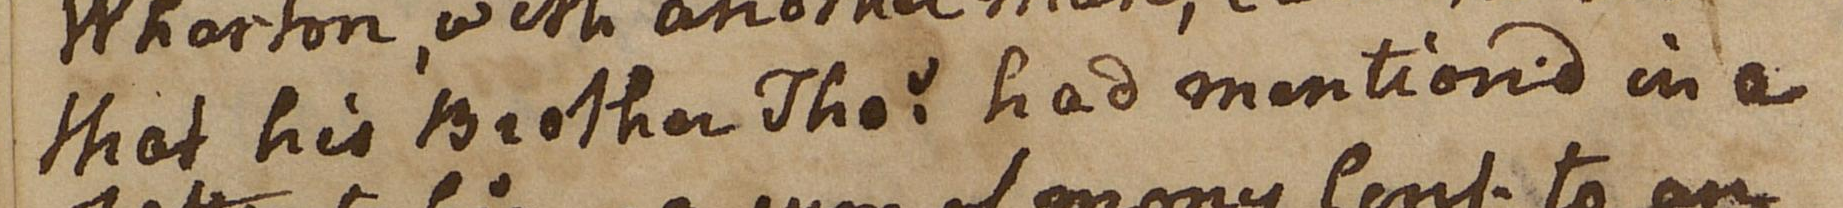that his Brother Tho^s. had mention'd in a
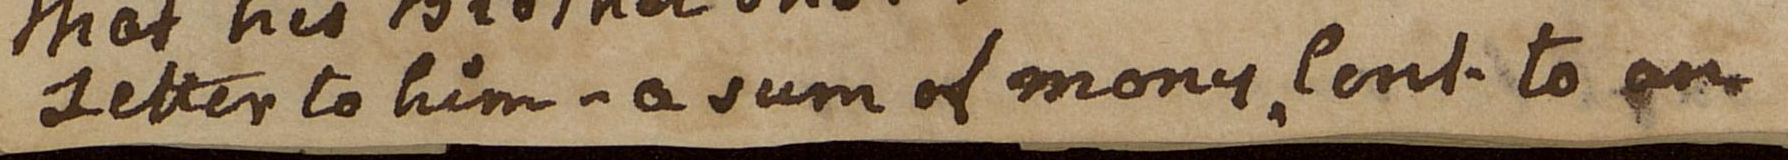Letter to him- a sum of mony, lent to an
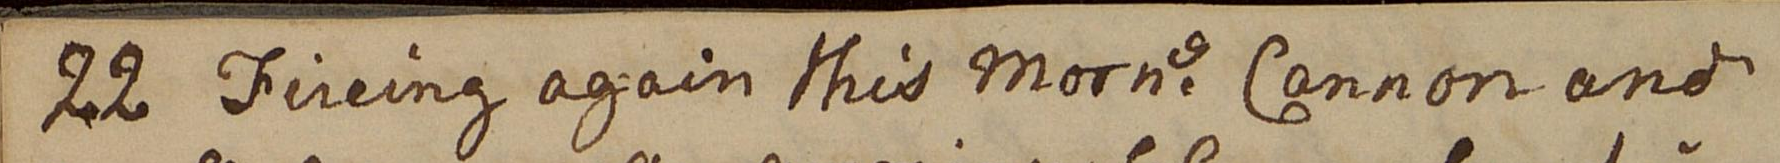22 Fireing again this Morn^g. Cannon and
